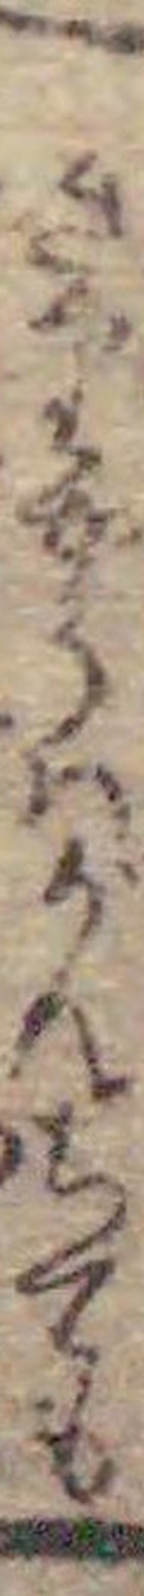きりやうはがんちても
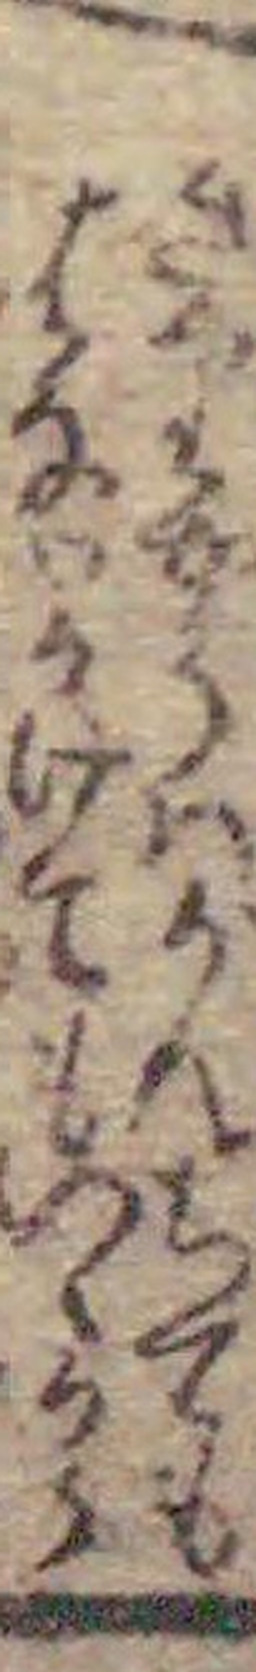はなつかけてもいゝから
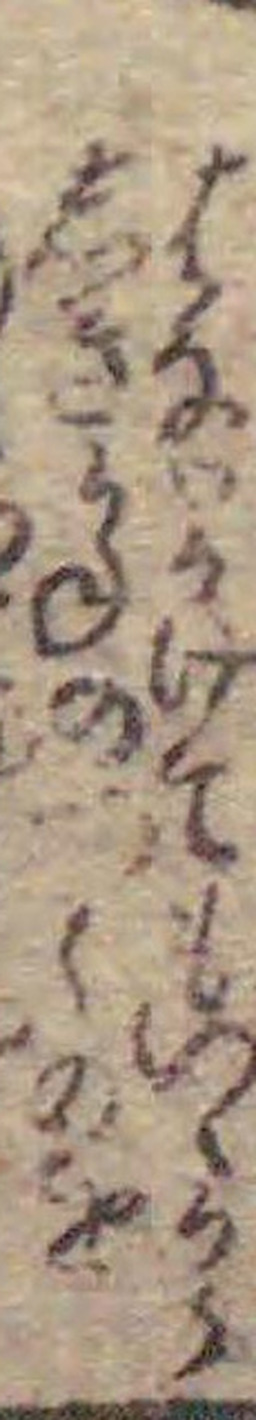しきかねのつくのを
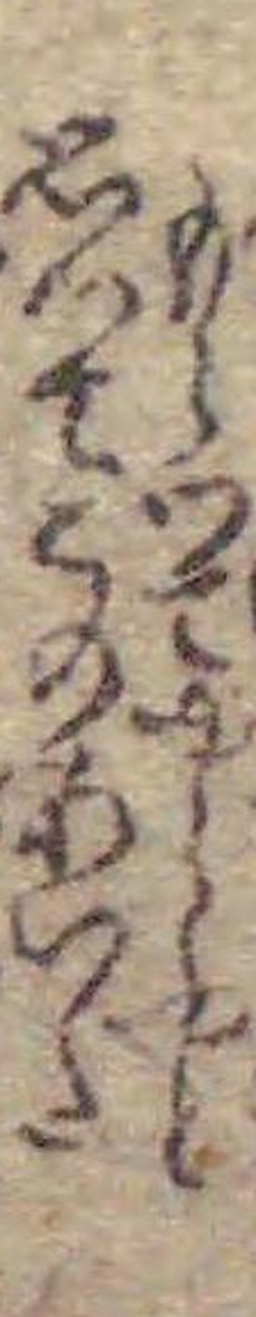思つてこのあいだ
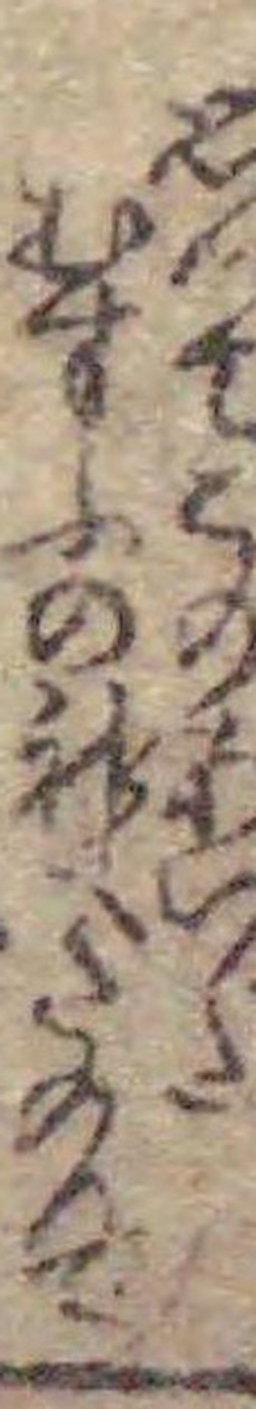むすふの神へたのんで
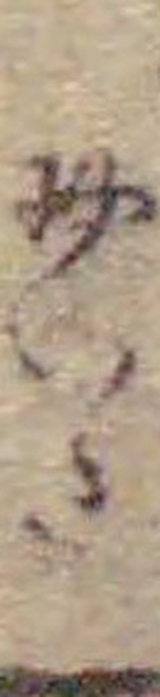おいた
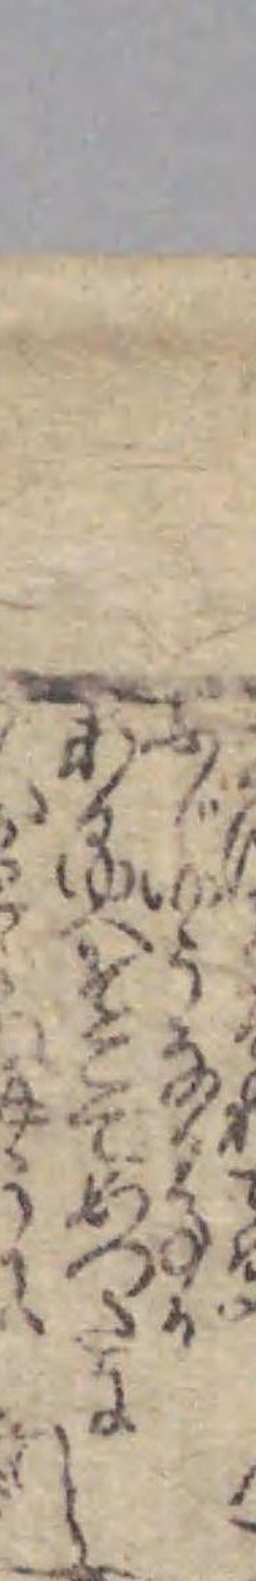あるゆへそこてめつたに
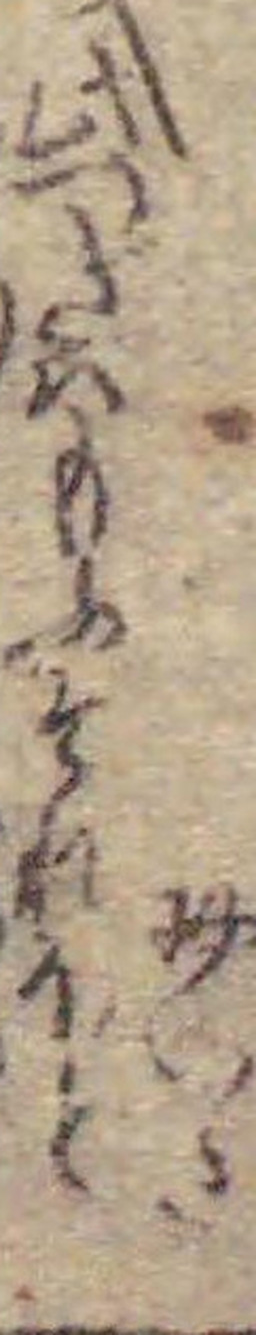〽此つぎはもふそれほと
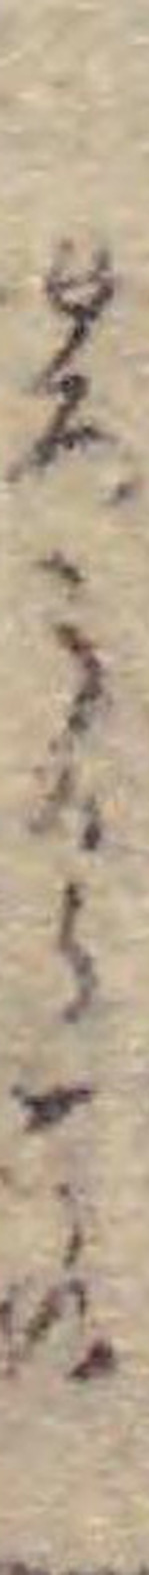やろうからこの
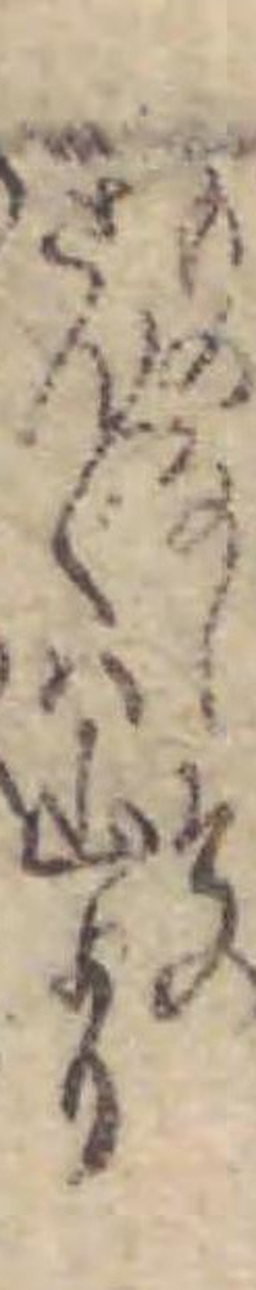きん〴〵は山より
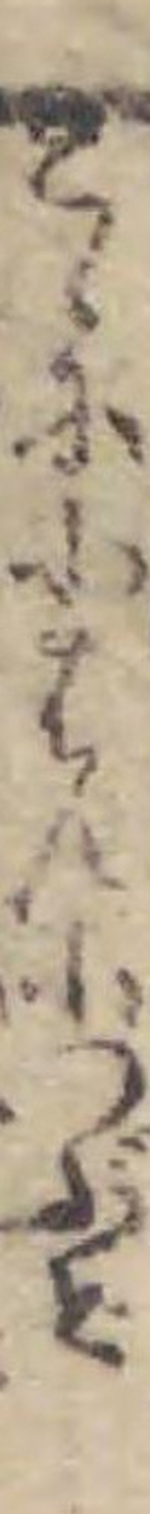こゝに小はん小つぶと
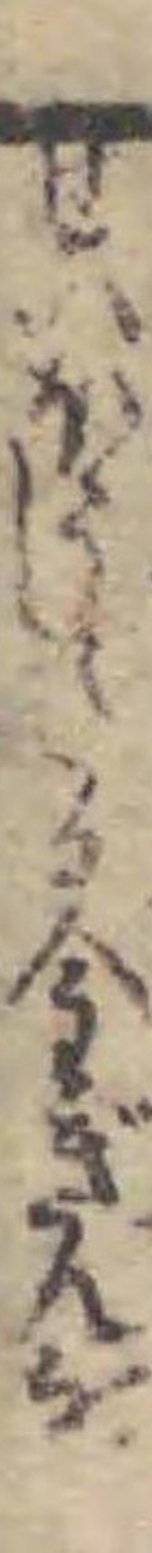せいほうしたる金ぎんを
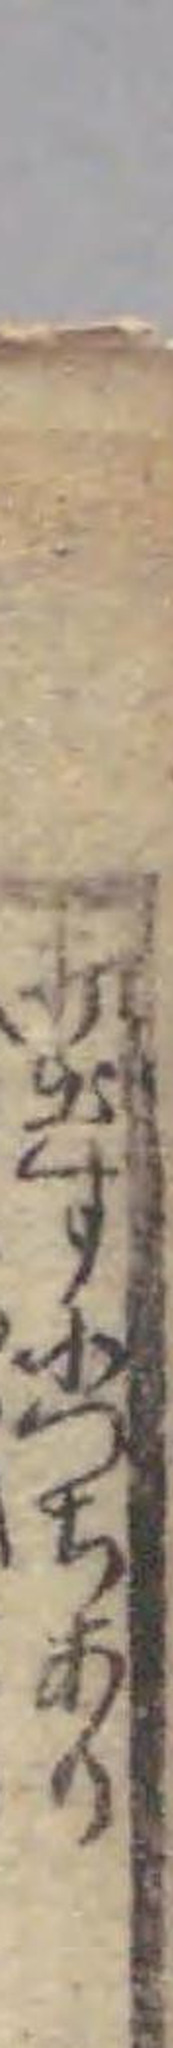打出す小つちあり
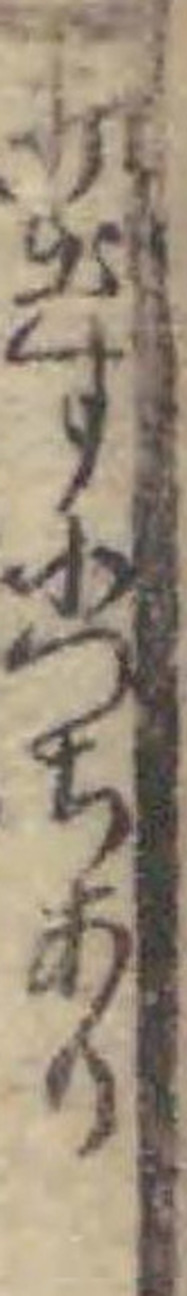打出す小つちあり
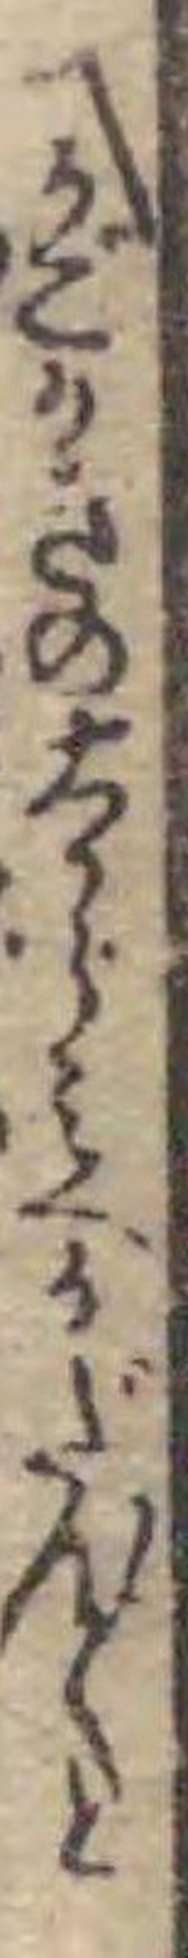〽かごかきの太郎兵へかだん〳〵と
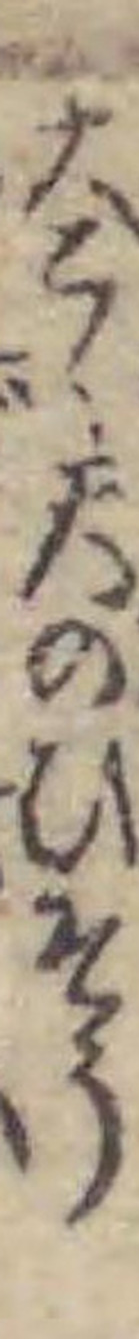大こく天のひそう
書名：新鋳小判 : 3巻
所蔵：国立国会図書館 National Diet Library, JAPAN
